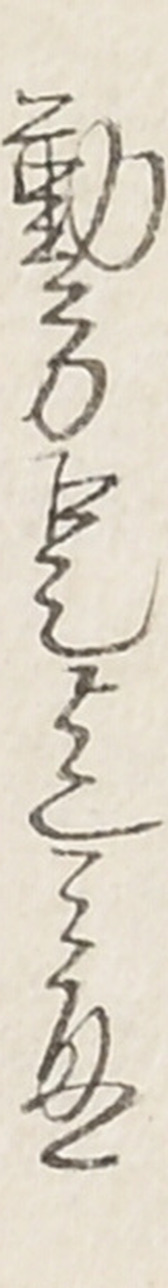勤方是迄之通
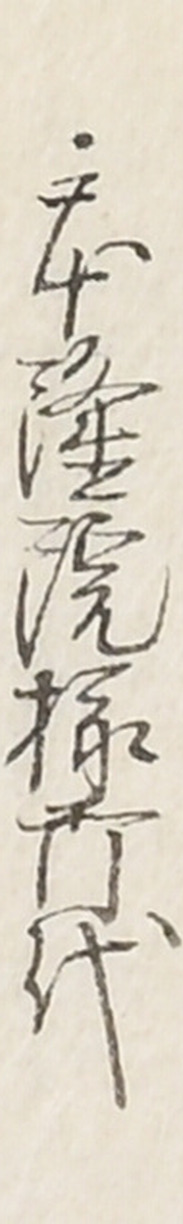本隆院様御代
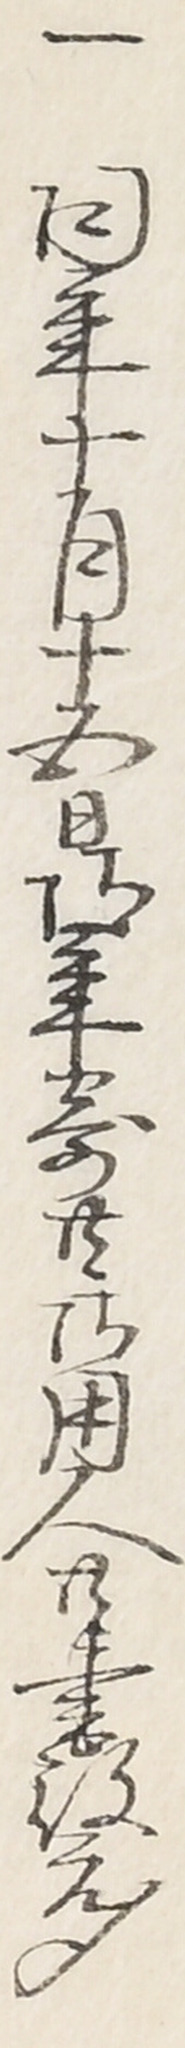一同年十月十五日御年寄共御用人共書役元〆
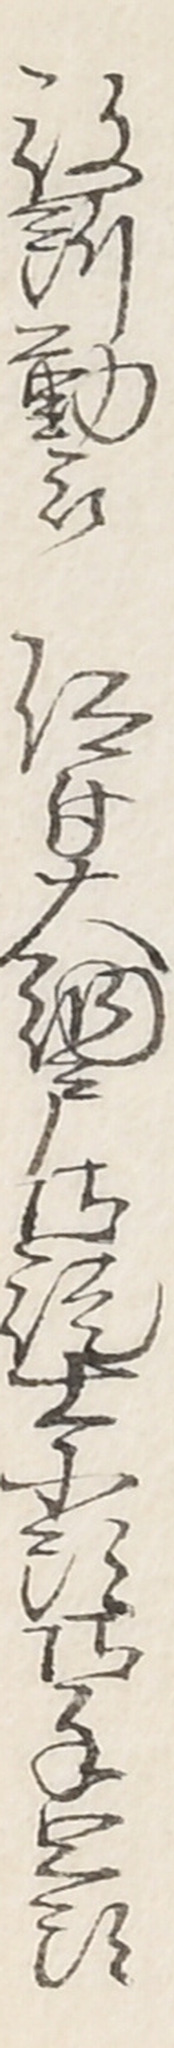役所勤被仰付大納戸御徒士小頭御手廻頭
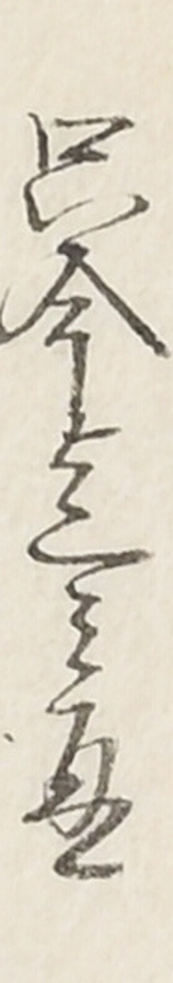只今迄之通
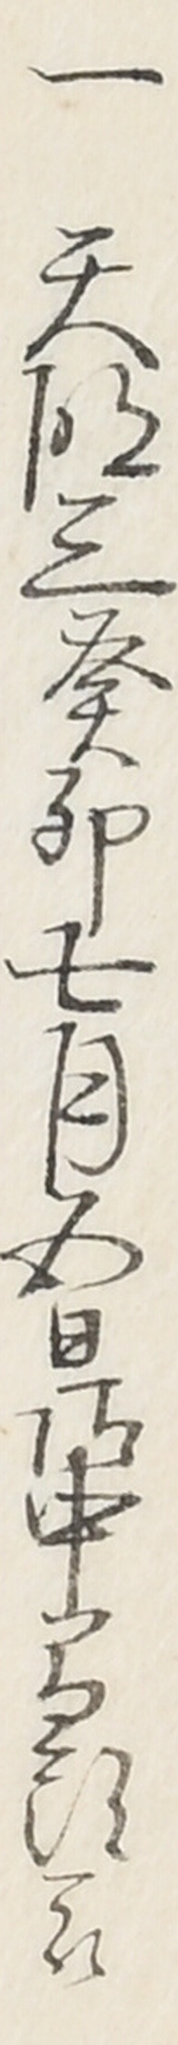一天明三癸卯七月五日御中間頭被
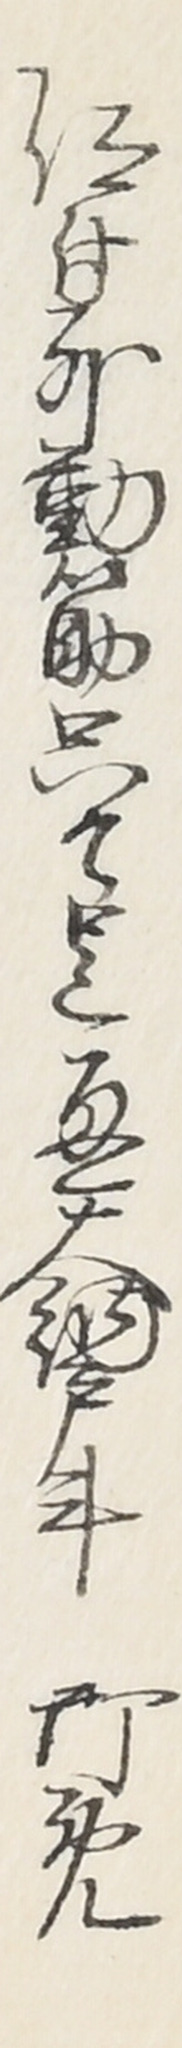仰付外勤筋只今迄通大納戸計御免
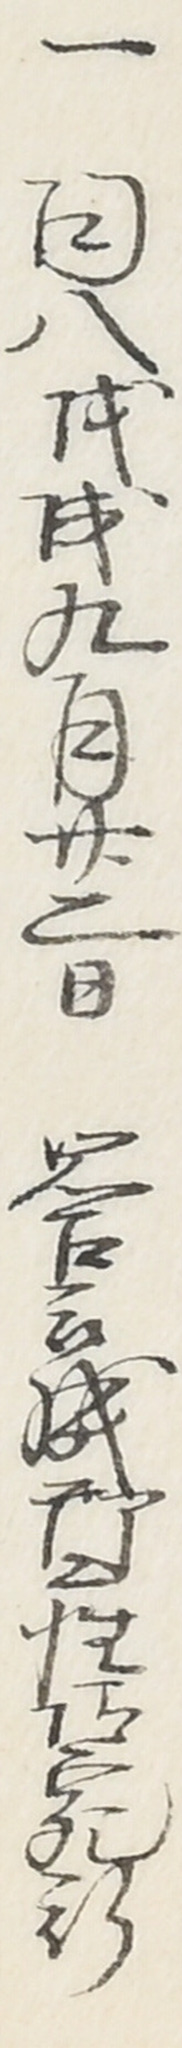一同八戊戌九月廿二日思召被成御座御宛行
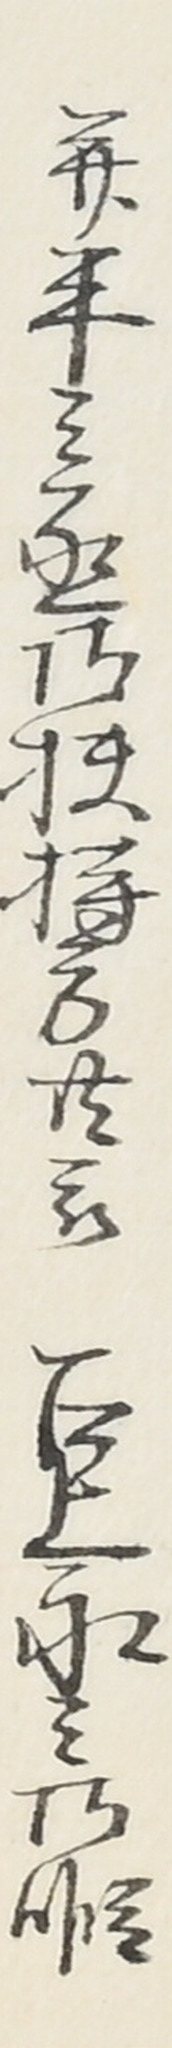并平之丞御扶持方共被召上永之御暇
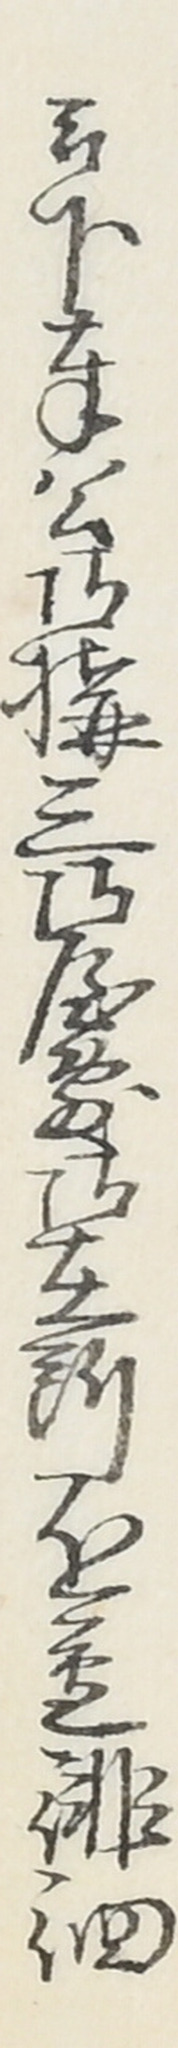被下奉公御構三御屋敷御在所近辺徘徊
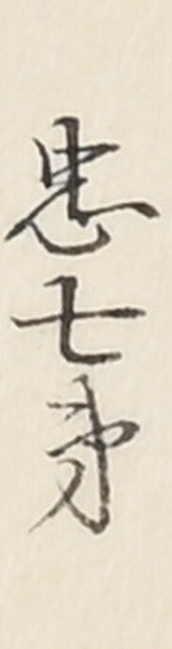忠七弟
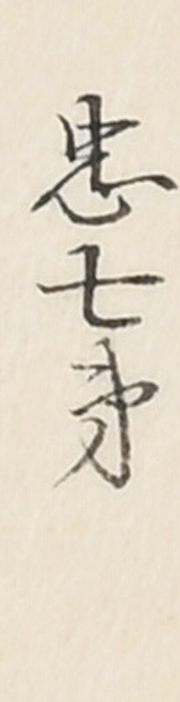忠七弟
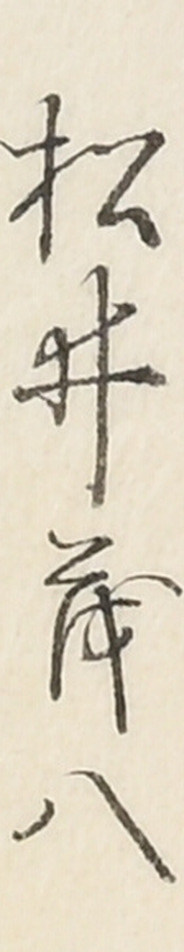松井茂八
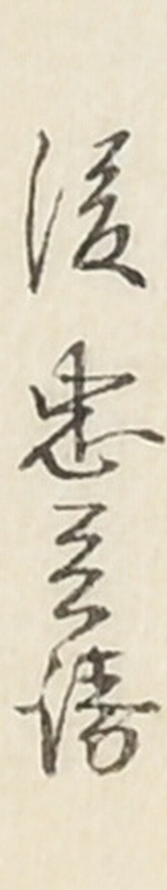後忠兵衛
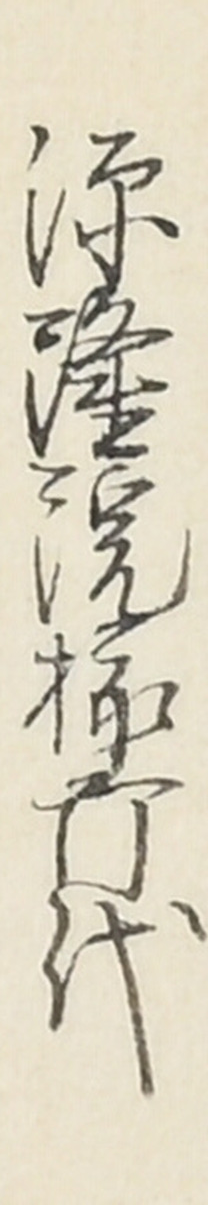源隆院様御代
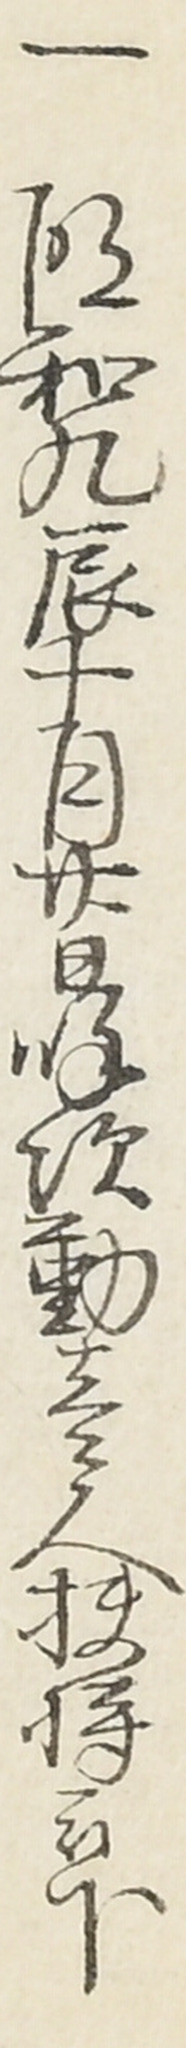一明和九辰十月廿日呼次勤壱人扶持被下
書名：無足諸士勤仕録（四）
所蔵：伊那市立高遠町図書館・合同会社AMANE
